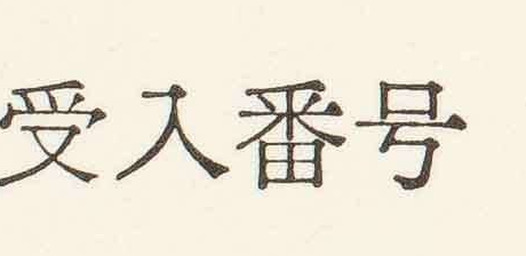受入番号
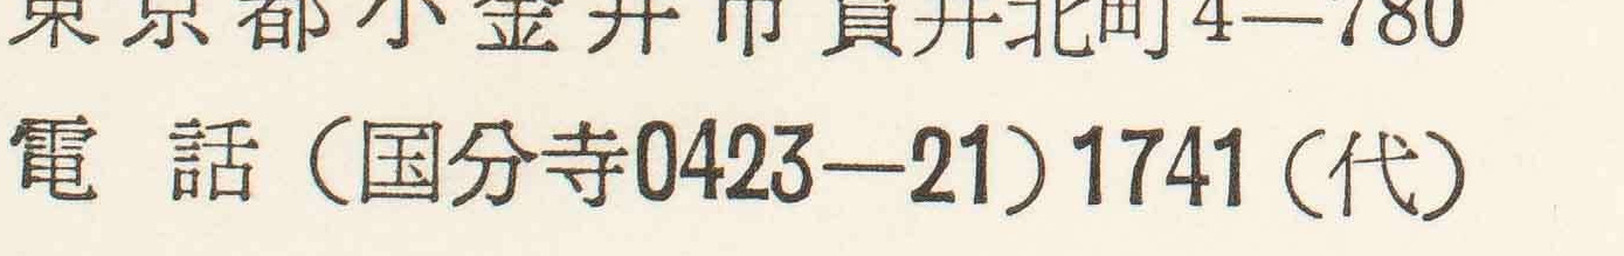電話(国分寺ー)(代)
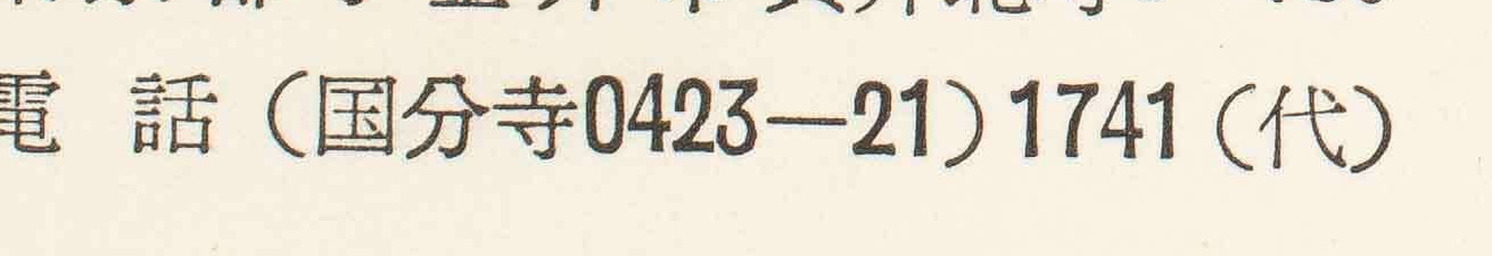電話(国分寺ー)(代)
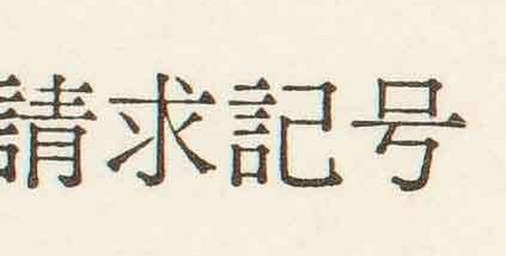請求記号
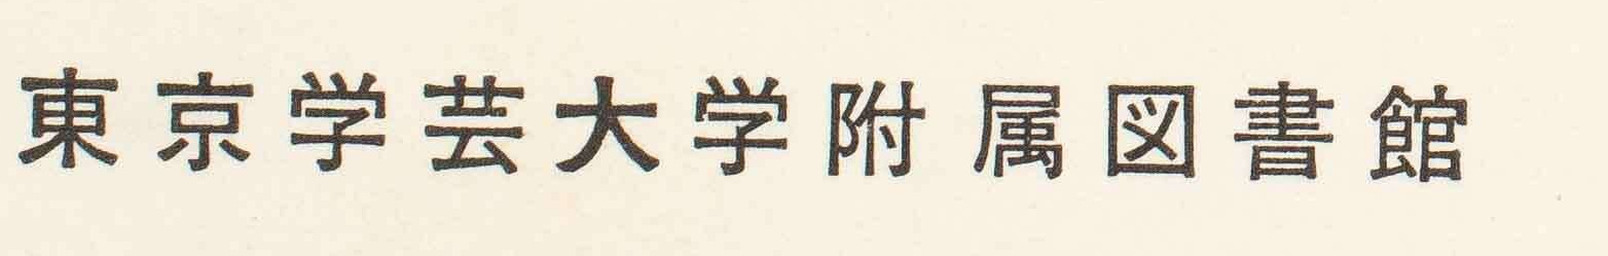東京学芸大学付属図書館
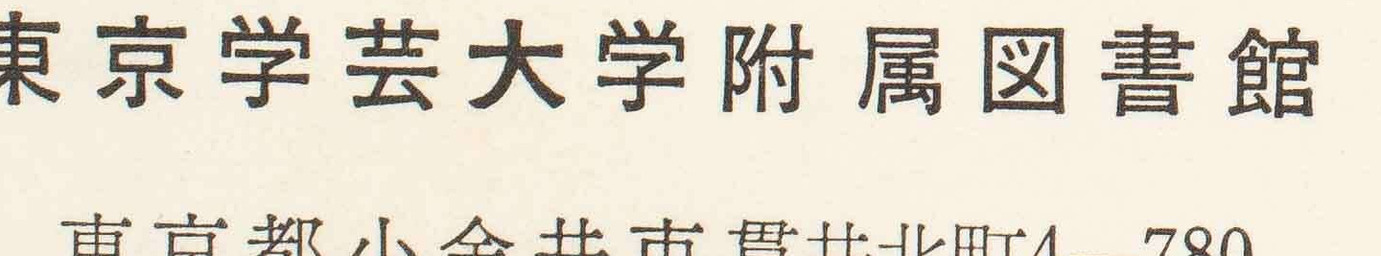東京学芸大学付属図書館
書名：古今相撲大全
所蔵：東京学芸大学附属図書館 国文学研究資料館
